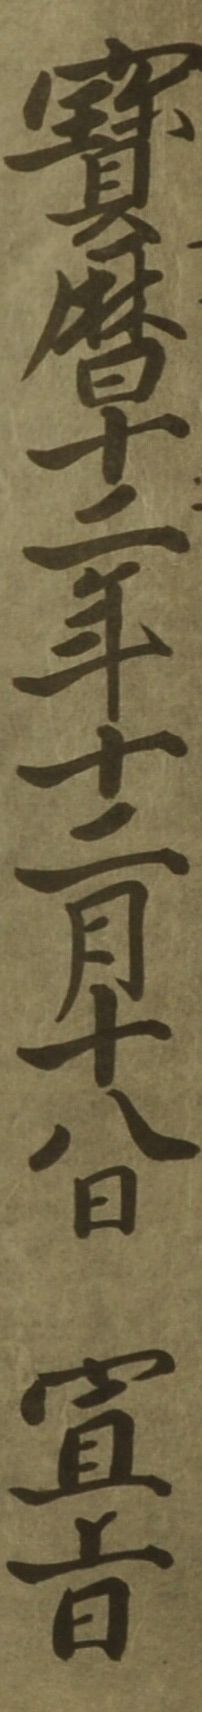宝暦十二年十二月十八日宣旨
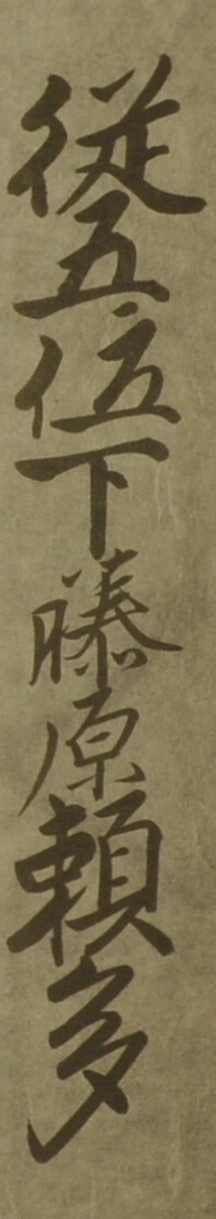従五位下藤原頼多
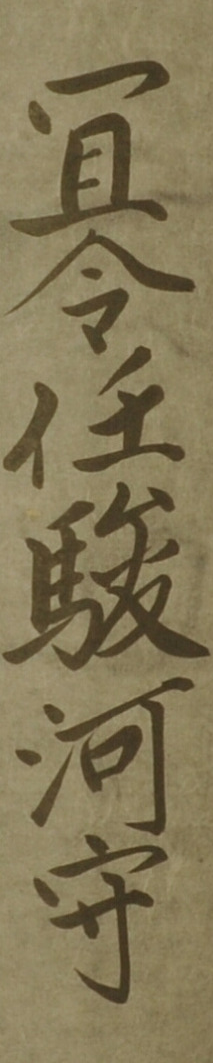宜令任駿河守
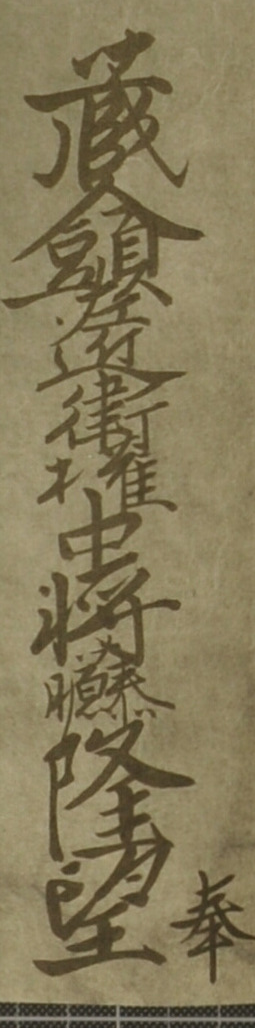蔵人頭左近衛権中将藤原隆望

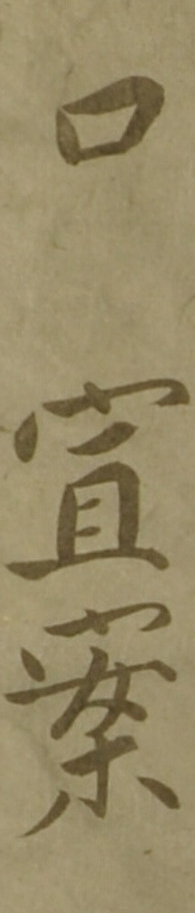口宣案
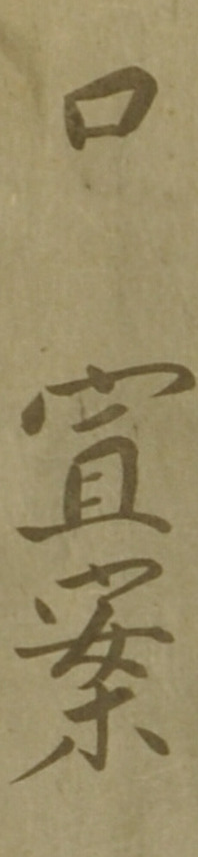口宣案

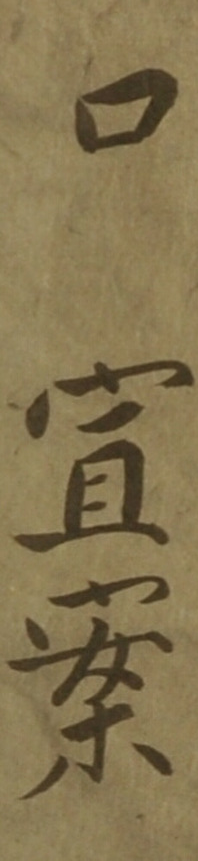口宣案
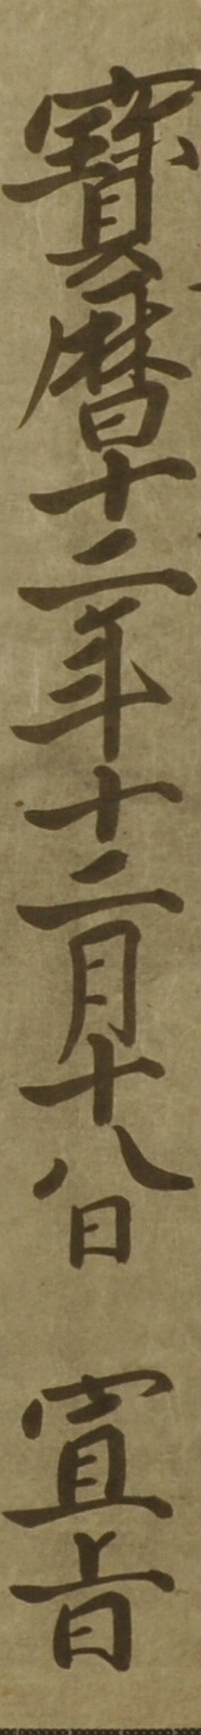宝暦十二年十二月十八日宣旨
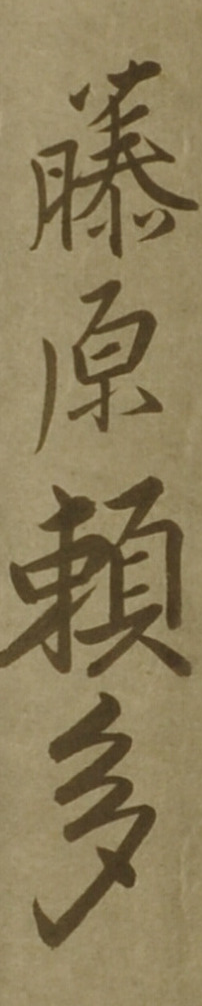藤原頼多
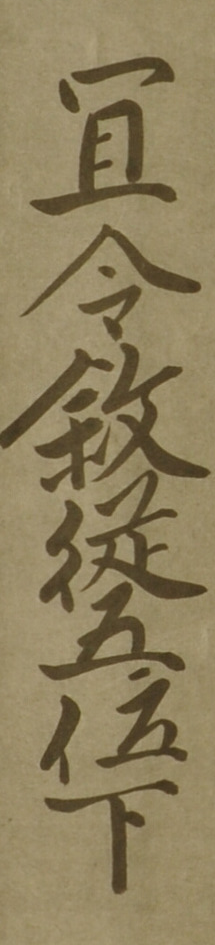宜令叙従五位下
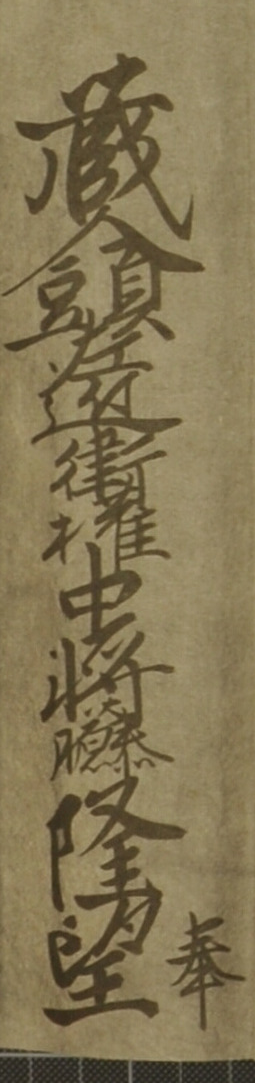蔵人頭左近衛権中将藤原隆望

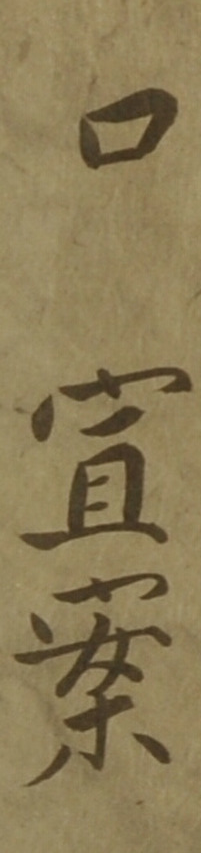口宣案
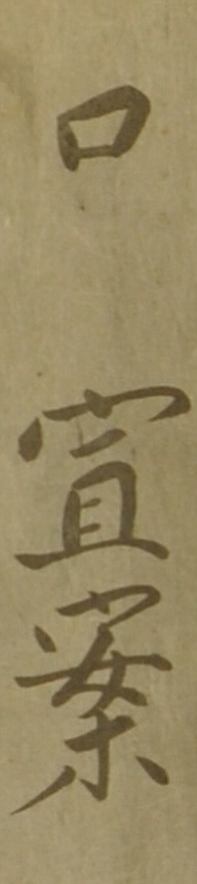口宣案
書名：口宣案・宣旨・位記
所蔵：伊那市立高遠町図書館・合同会社AMANE
